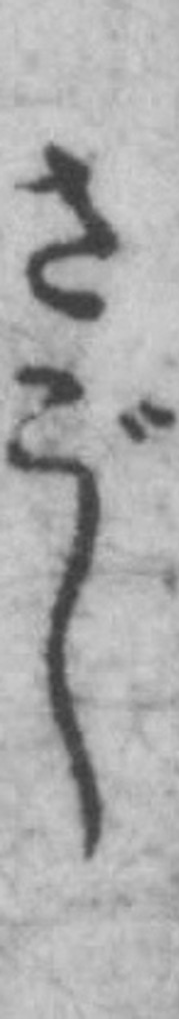さごし
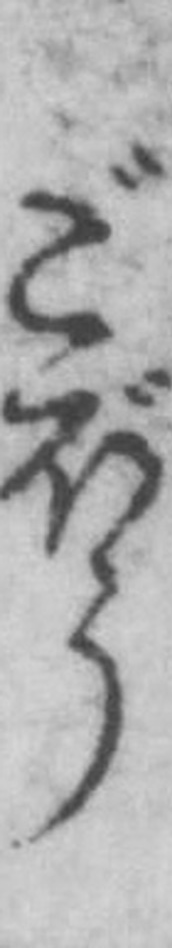ごぼう
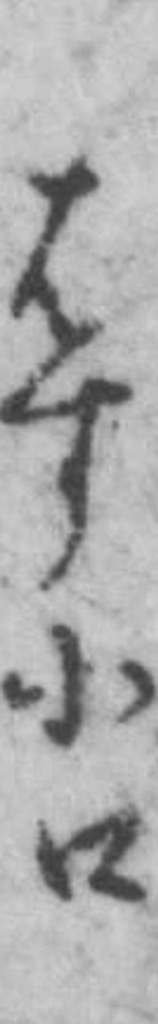はす小口
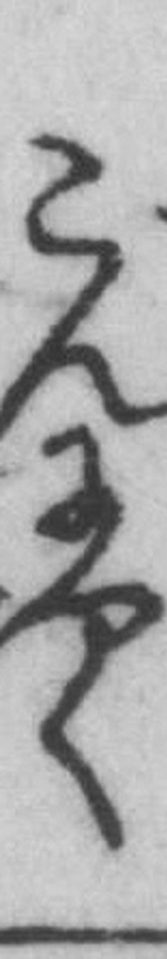こんにやく
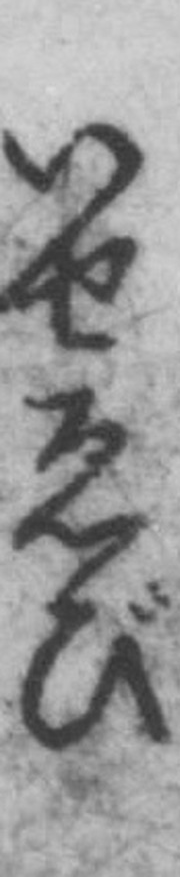いせゑび
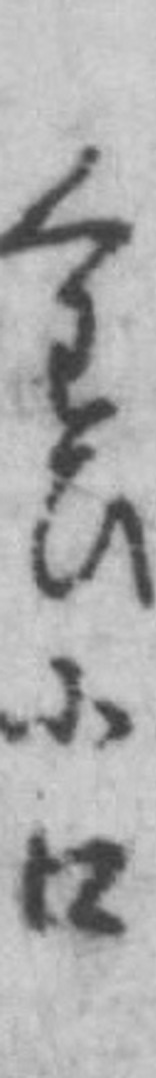くわひ小口
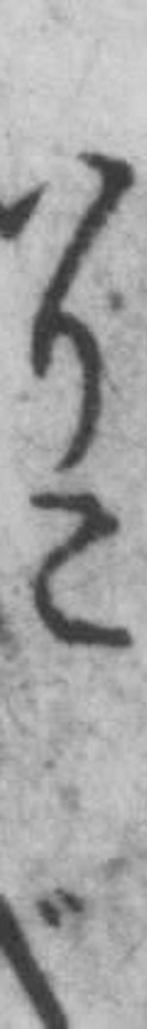いりこ
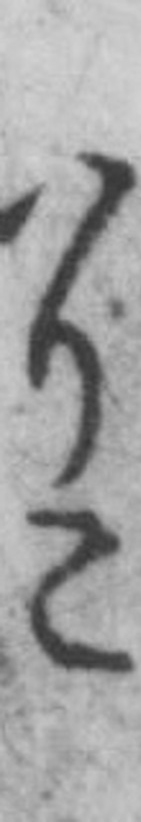いりこ
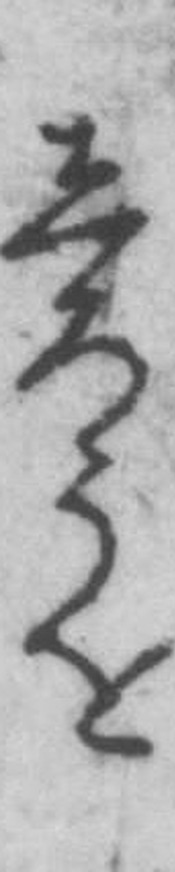しろうを
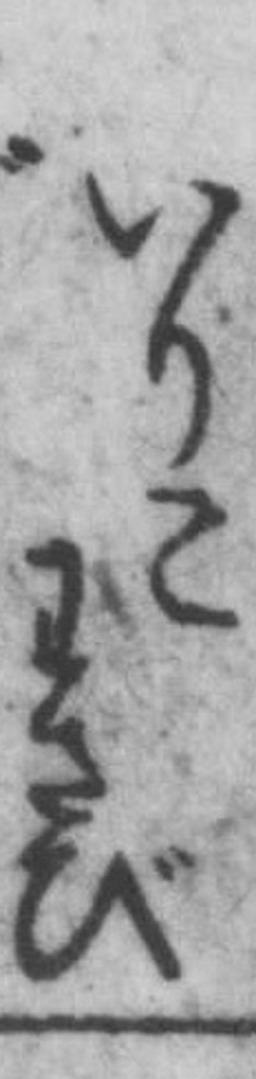わさび
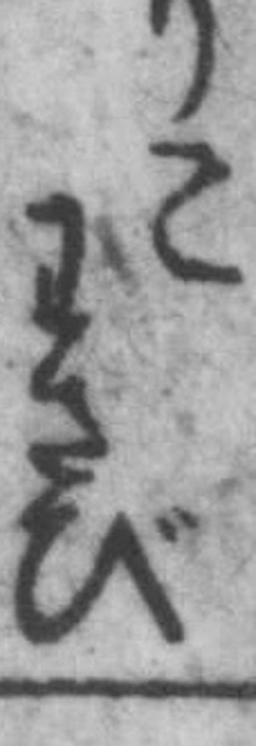わさび
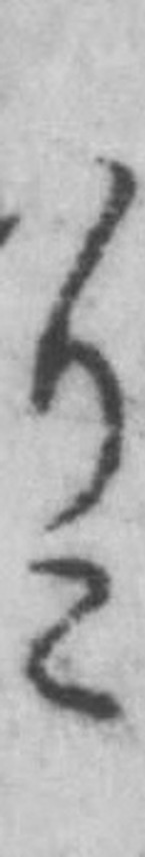いりこ
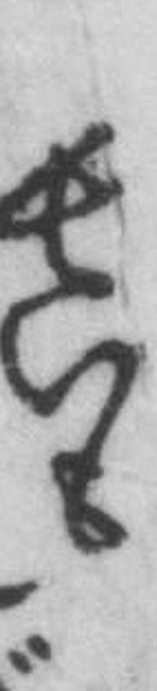長いも
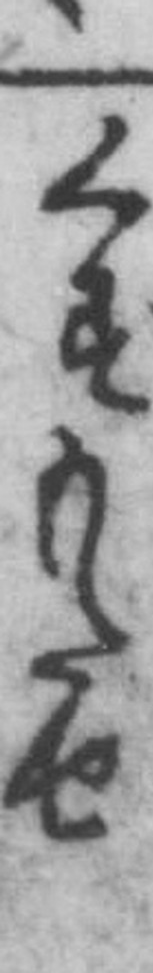くずもたせ
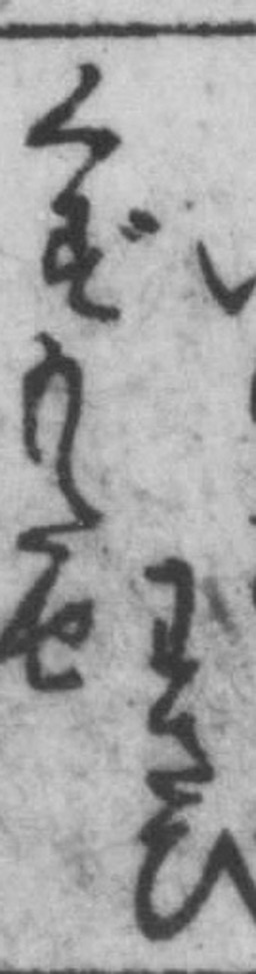くずもたせ
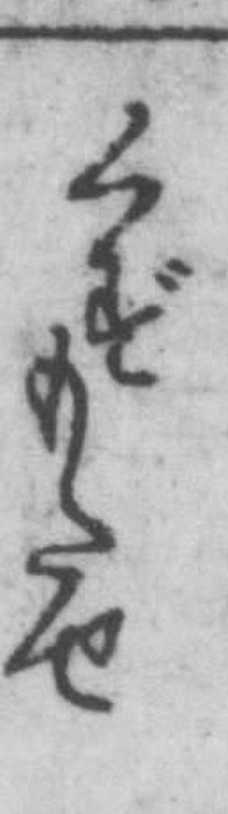くずもたせ
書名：料理献立抄
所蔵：大阪府立大学学術情報センター 国文学研究資料館
